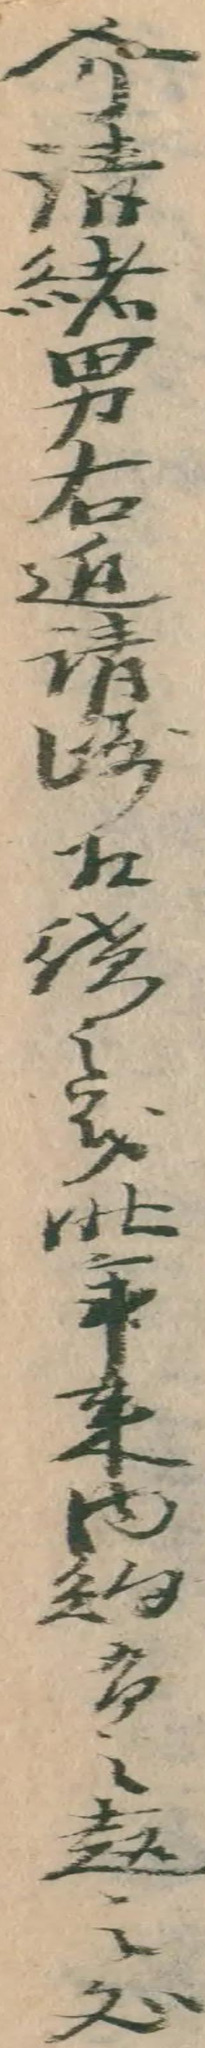介清緒男右近清崎相談之義昨年来内約有之趣之処

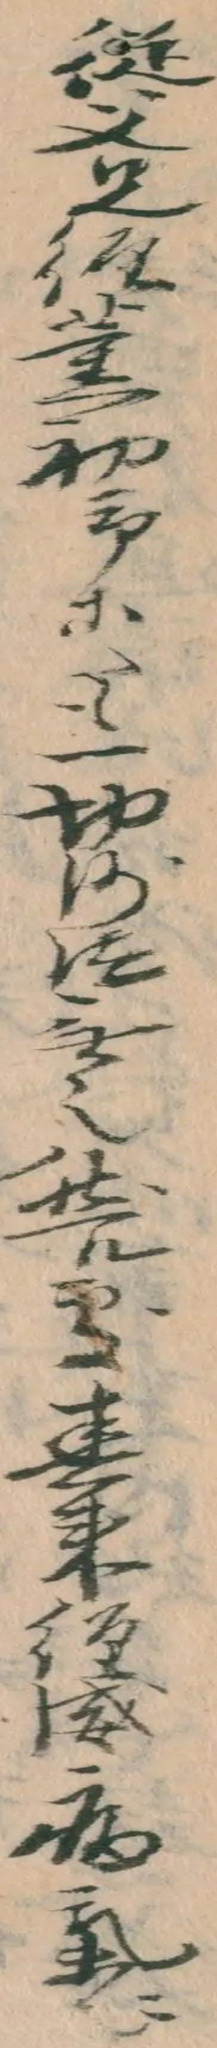従父兄経董勤予等へも一切沙汰無之然ル處春来経威病氣ニ
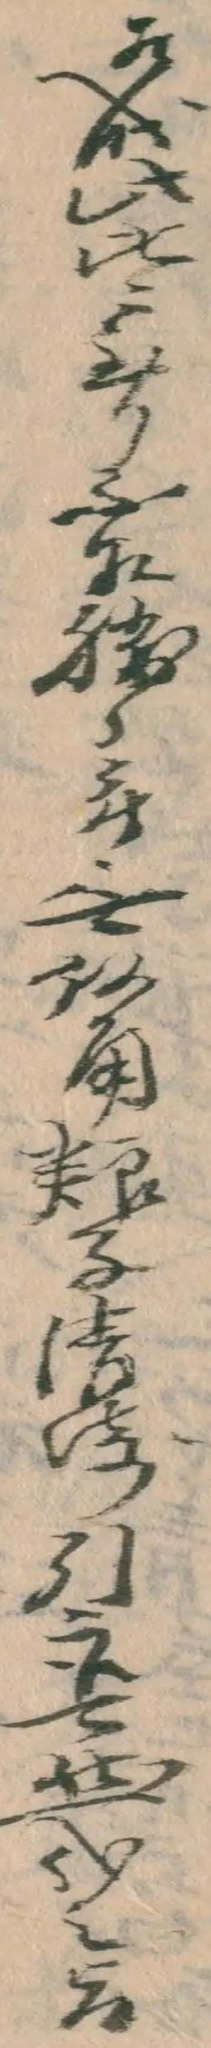相成此比ニ至り不相勝候ニ付無何角養子清崎引取可然哉之旨
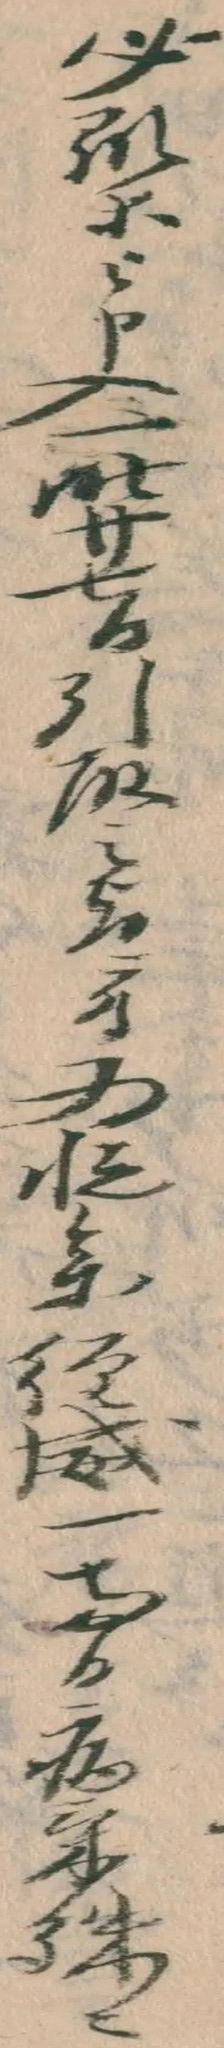必顕等被申入一昨廿七日引取之旨ニ付為祝参経威一両日病氣殊ニ
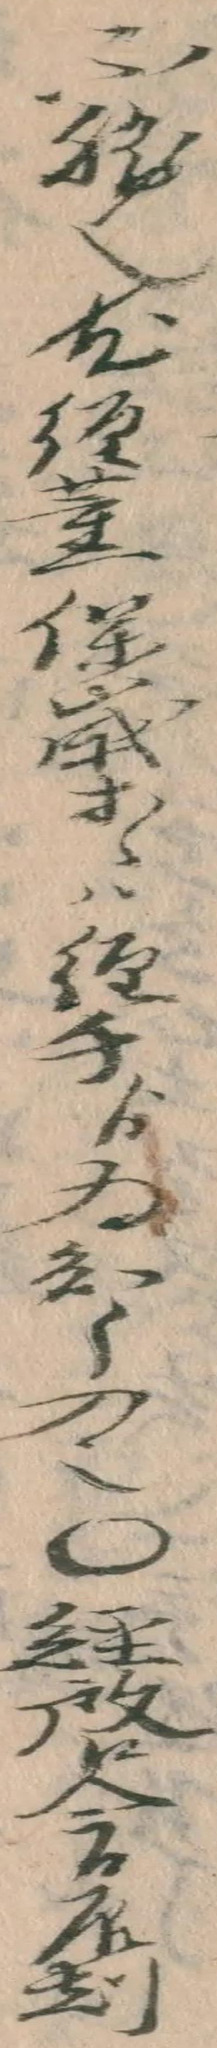不勝也尤経董保歳等ヘハ経千ゟ為知申入也○経啓今日辰刻
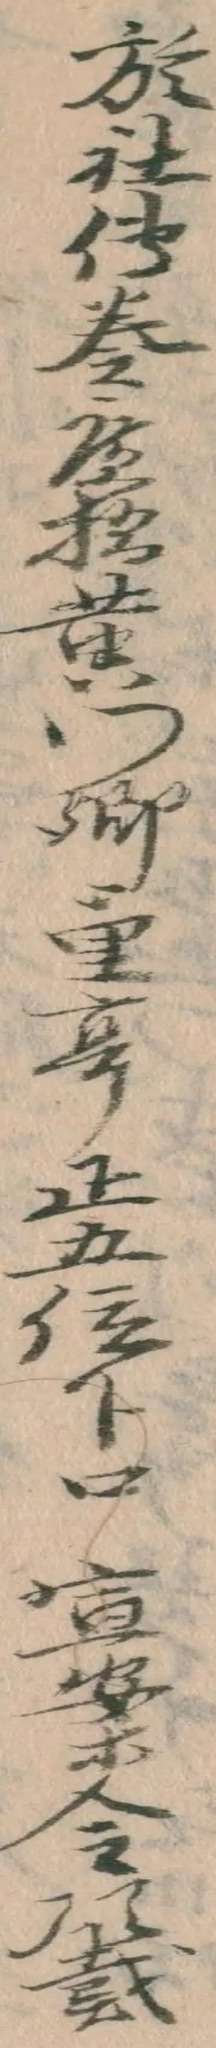於社傳奏廣橋黄門卿御里亭正五位下口宣案令頂戴
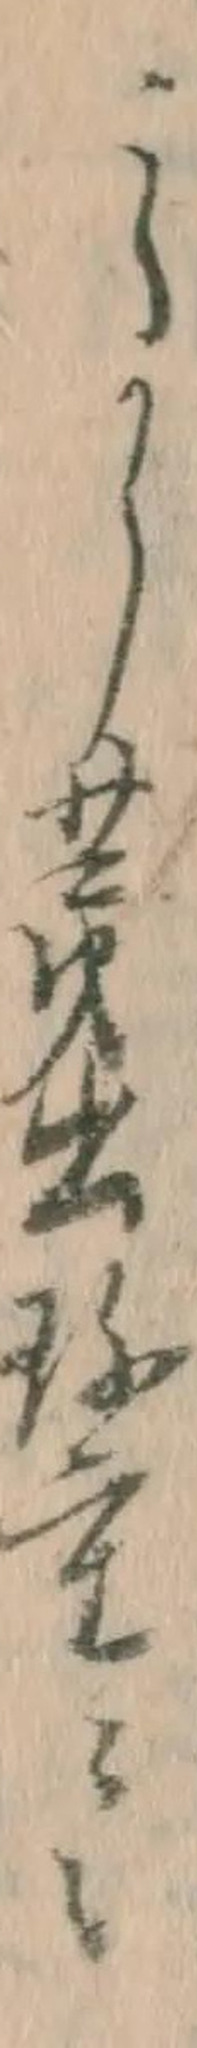之了芽出珍重々々
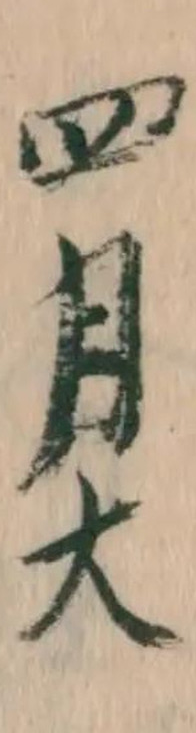四月大
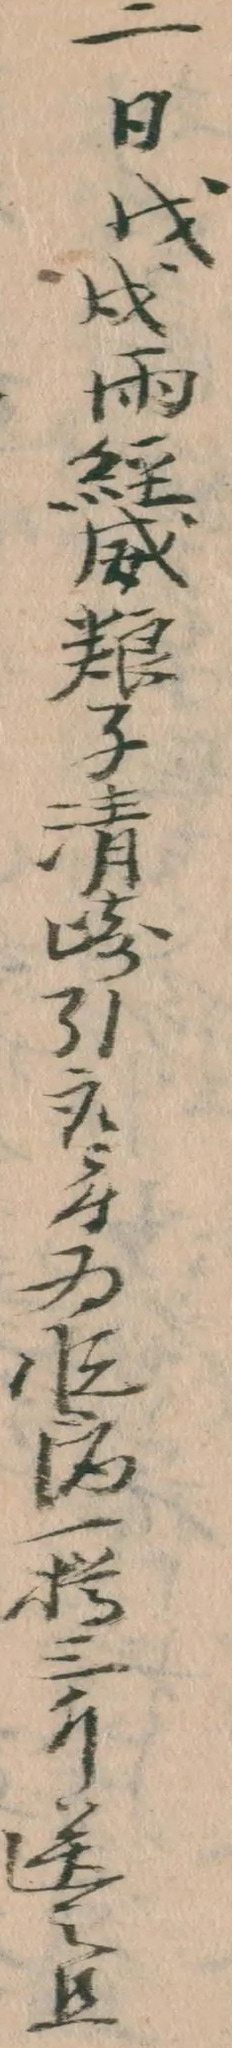二日戊戌雨経威養子清崎引取ニ付為祝酒一樽三升送之且
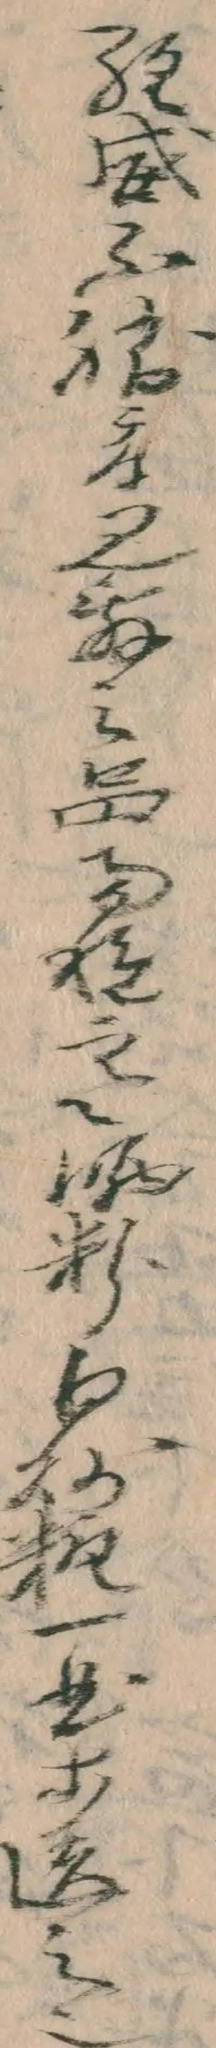経威不勝ニ付見舞之品両種之御晒粉白砂糖一曲等送之也
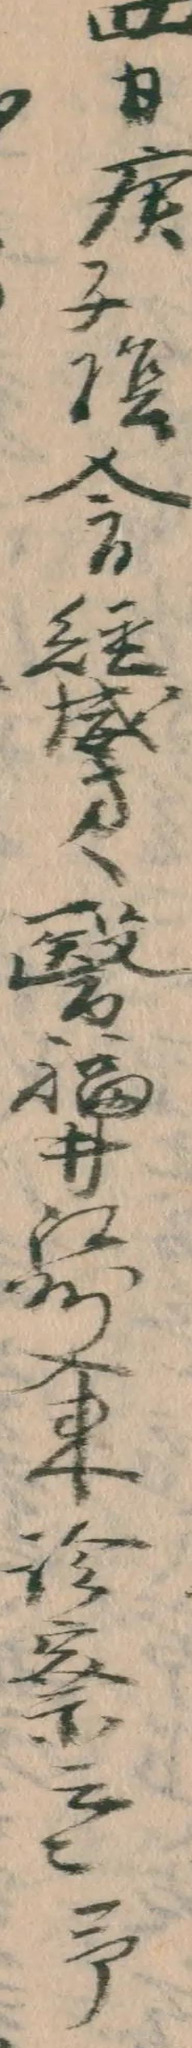四日庚子陰今日経威方へ医福井江州入来診察云々予
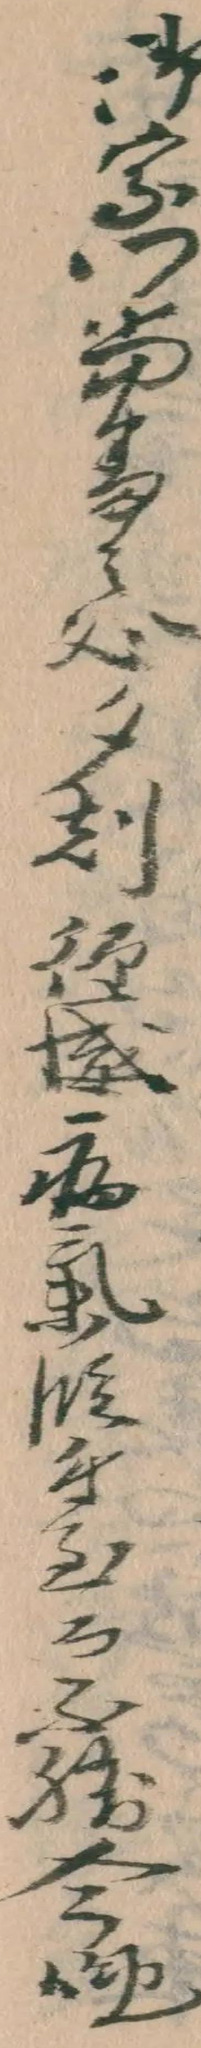御家門等當番之処夕刻経威病氣段付至而不勝今晩
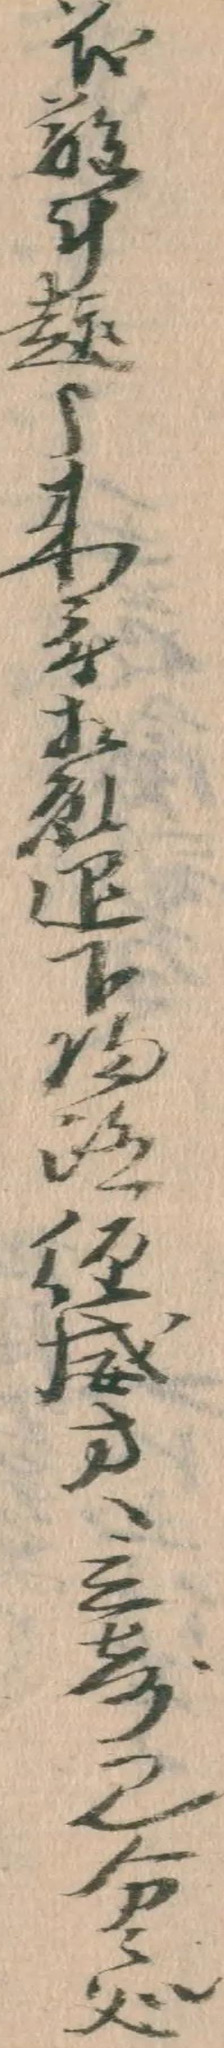節難斗趣申来ニ付相願退下帰路経威方へ立寄見分之処
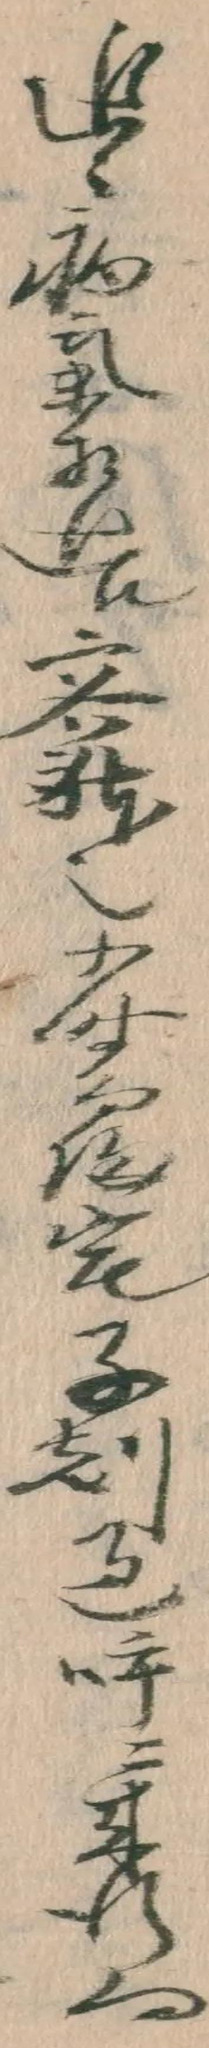追々病氣相廻ル容躰也小少時而帰宅子刻過呼ニ来行向
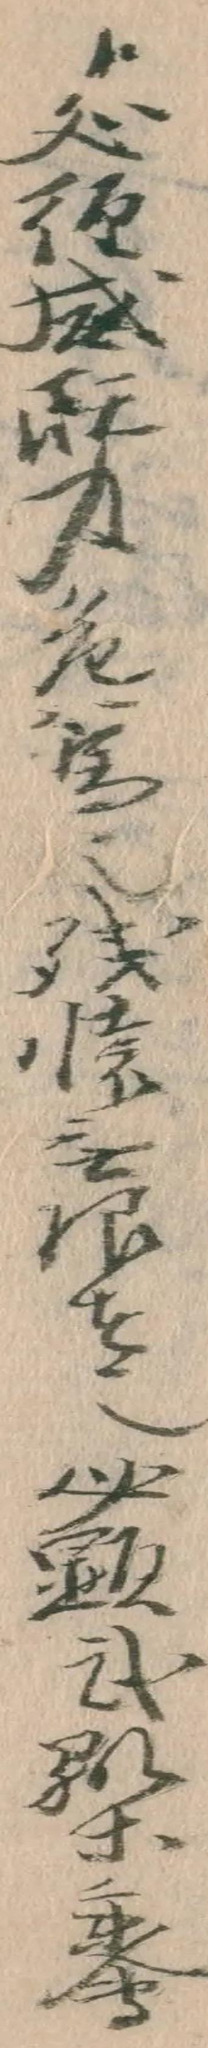候処経威既及危篤也残情無限者也必顕武顕等参會
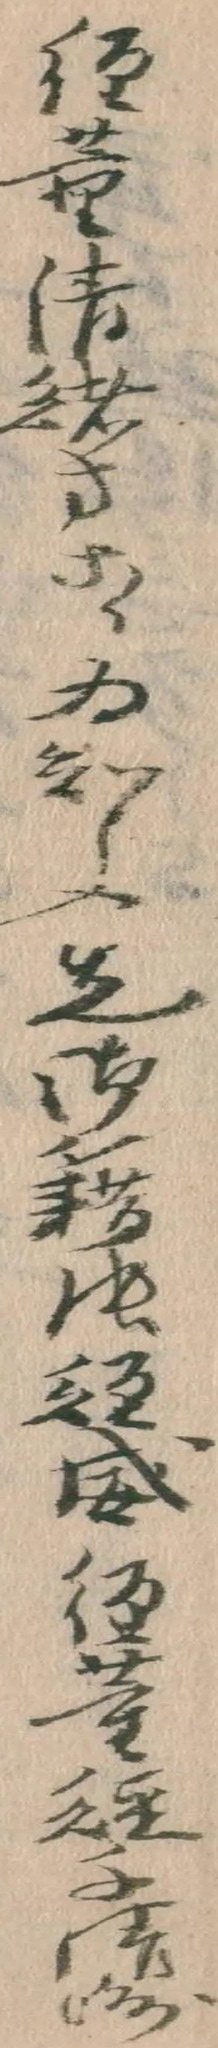経董清緒方等へ為知申入先御籍帳経威経董経千清崎
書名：賀茂社記録. 第69冊
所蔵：国立国会図書館 National Diet Library, JAPAN
